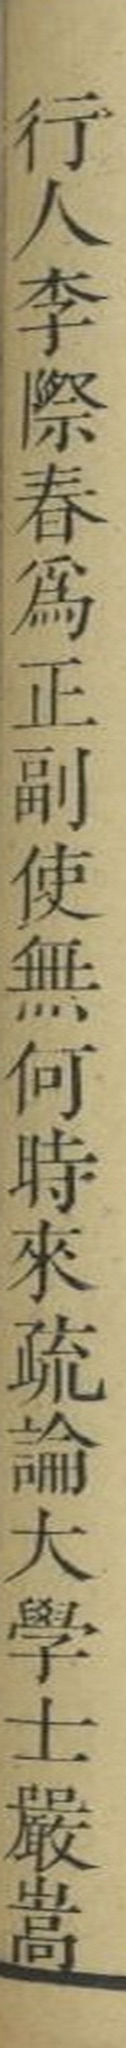行人李際春為正副使無何時来疏論大学士巌嵩
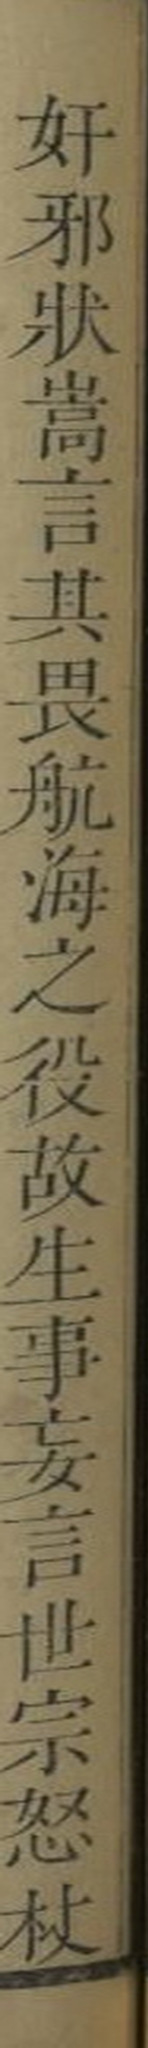奸邪状嵩言其畏航海之役故生事妄言世宗怒杖
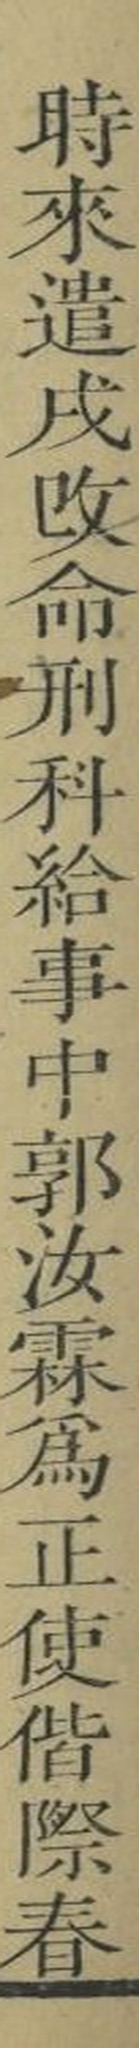時来遣戌改命刑科給事中郭汝霖為正使偕際春
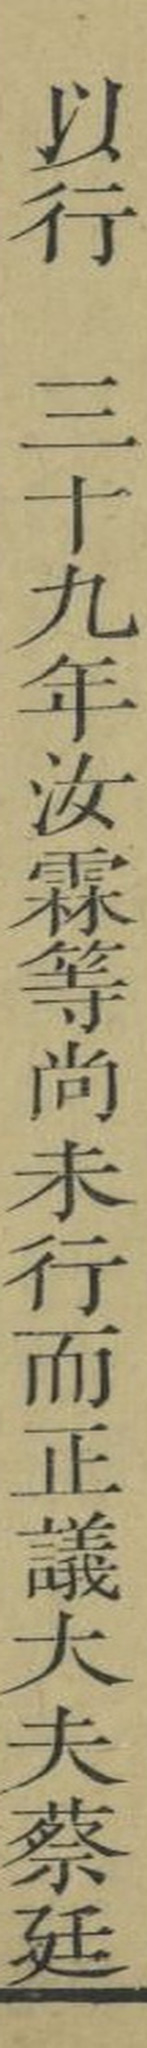以行三十九年汝霖等尚未行而正議大夫蔡廷
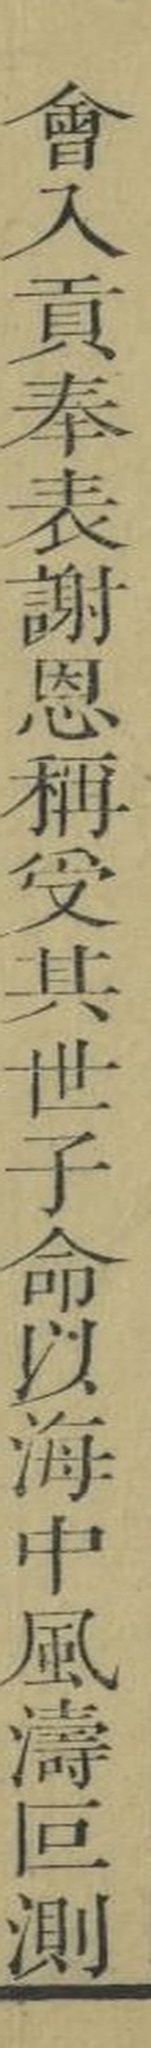会入貢奉表謝恩称受其世子命以海中風濤叵測
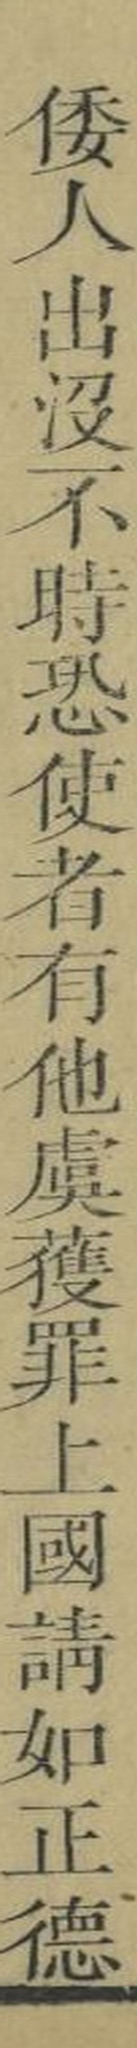倭人出没不時恐使者有他虞獲罪上国請如正徳
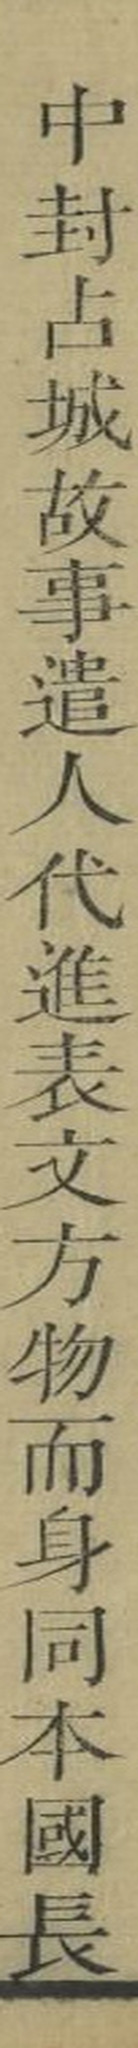中封占城故事遣人代進表文方物而身同本国長
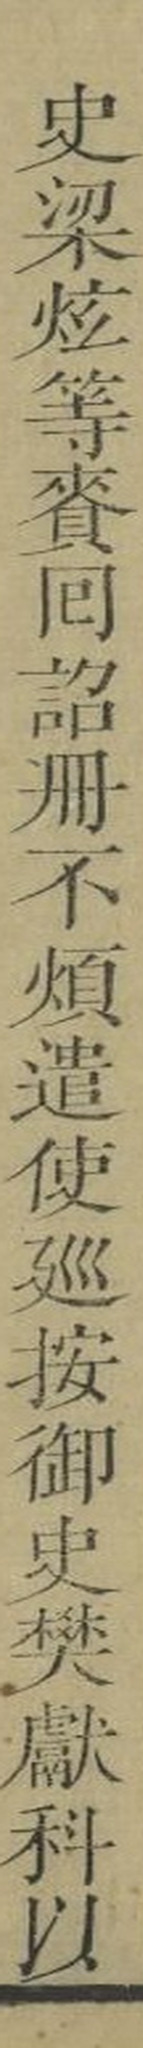史梁炫等賚回詔冊不煩遣使巡按御史焚献科以
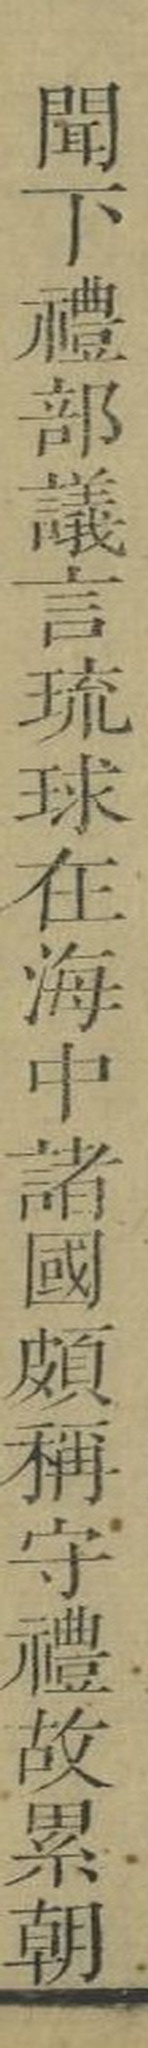聞下礼部議言琉球在海中諸国頗称守礼故累朝
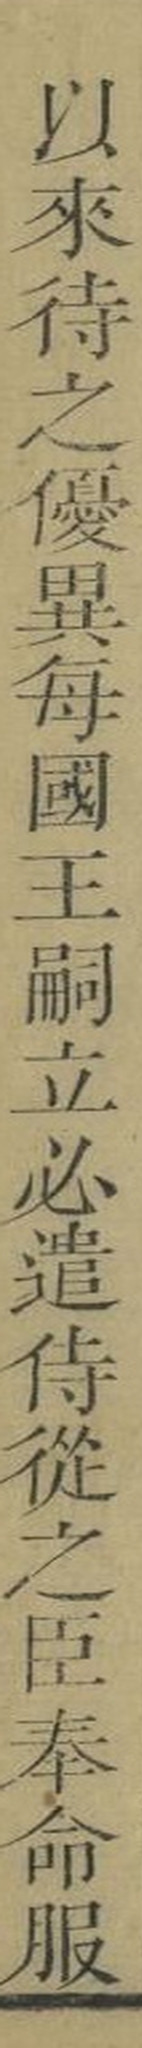以来待之優異毎国王嗣立必遣侍従之臣奉命服

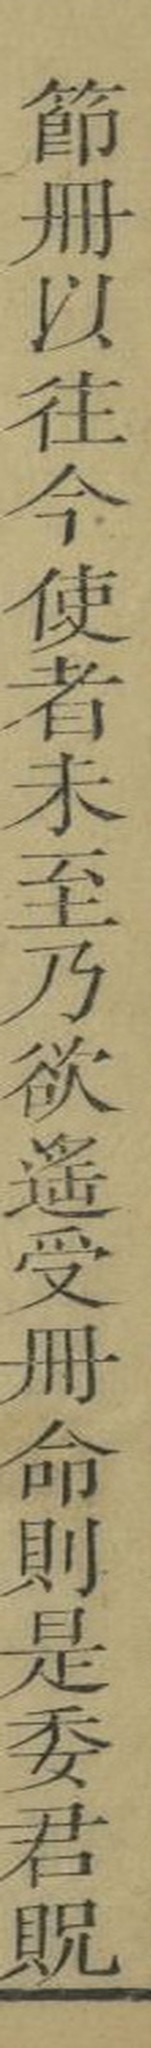節冊以往今使者未至乃欲遥受冊命則是委君貺
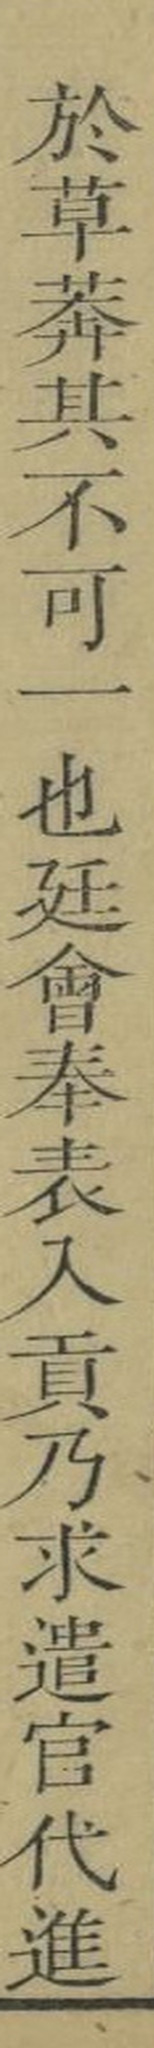於草莽其不可一也廷会奉表入貢乃求遣官代進
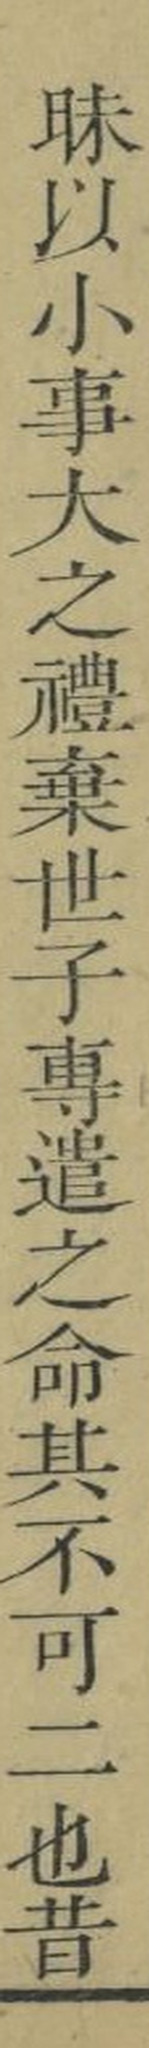昧以小事大之礼棄世子専遣之命其不可二也昔
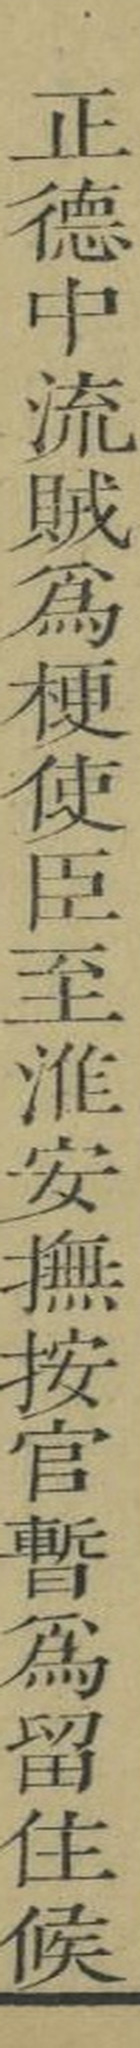正徳中流賊為梗使臣至淮安撫按官暫為留住候
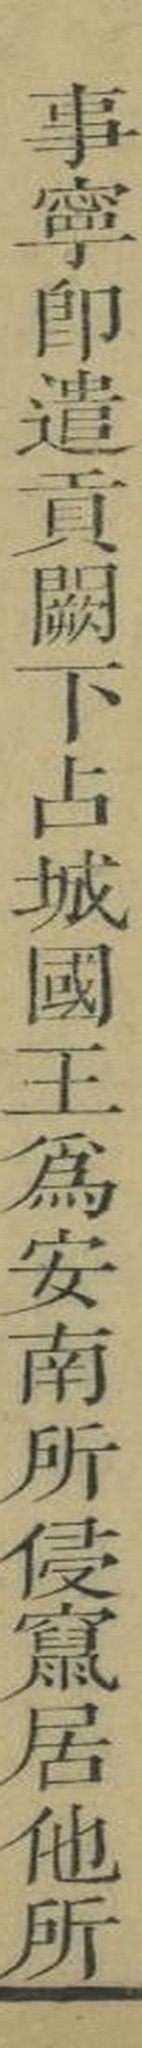事寧即遣貢闕下占城国王為安南所侵竄居他所
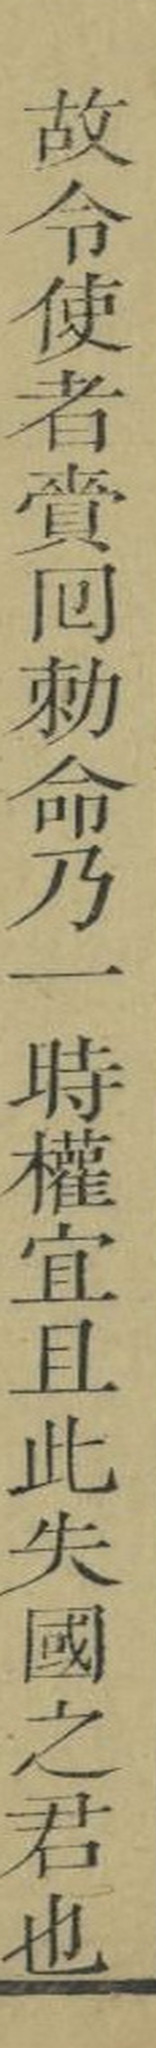故令使者賚回勅命乃一時権宜且此失国之君也
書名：中山伝信録 巻三
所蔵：University of the Ryukyus Library
